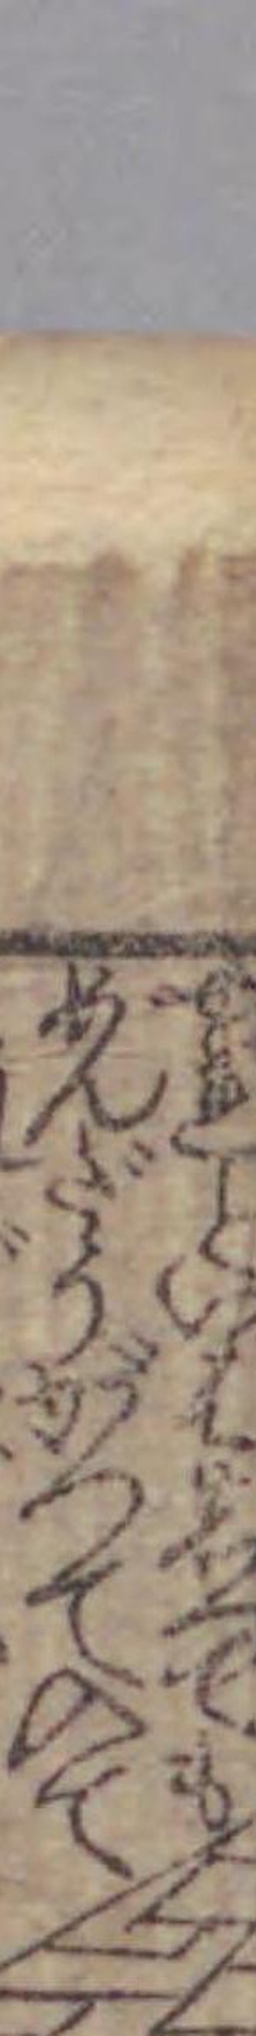めんだうがつて入て
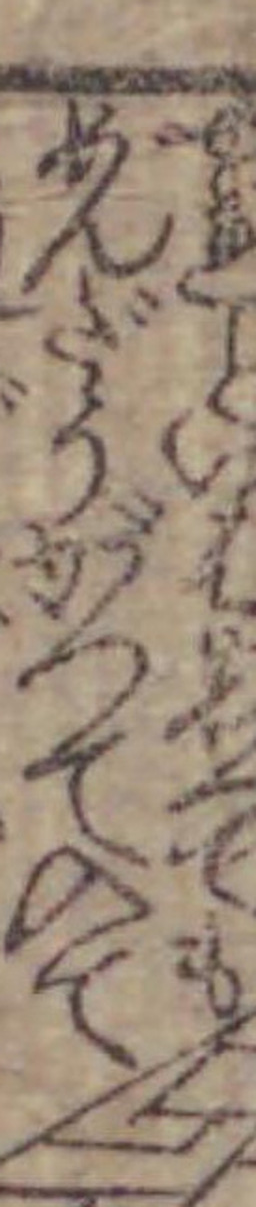めんだうがつて入て
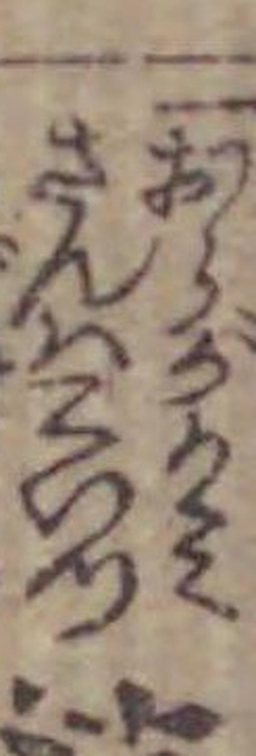さんはこいつ
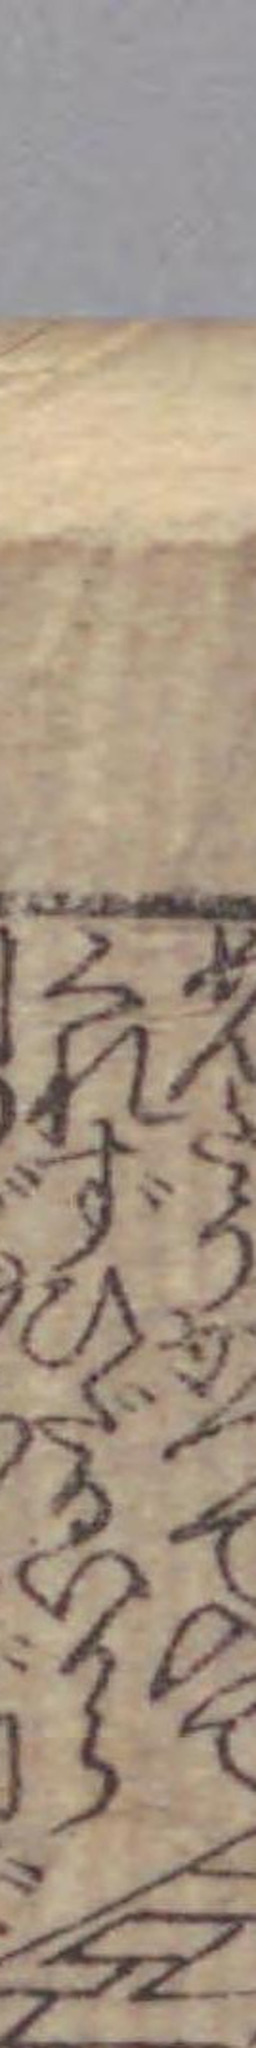くれずひだるいから
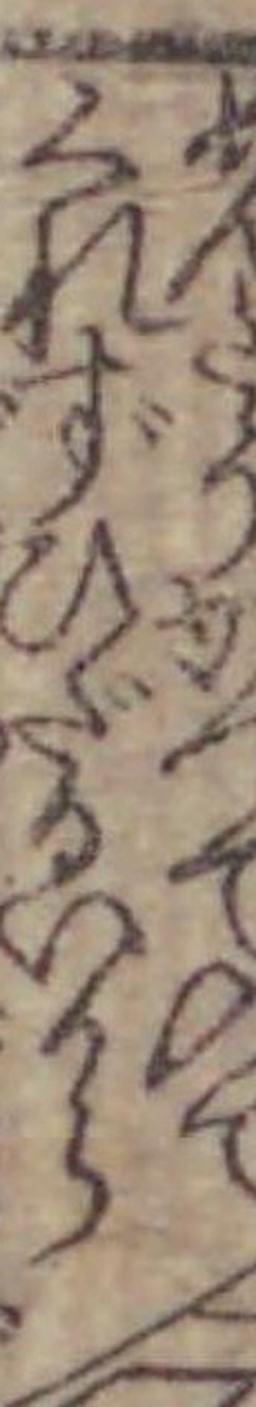くれずひだるいから
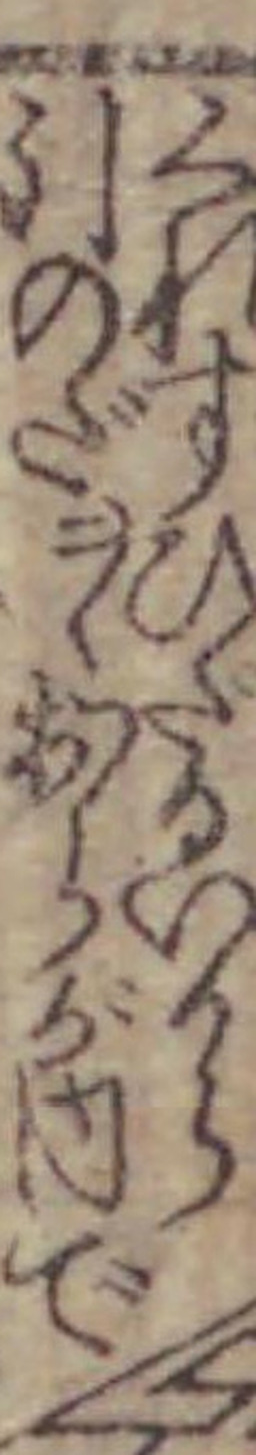引のだヲヽおらが内で
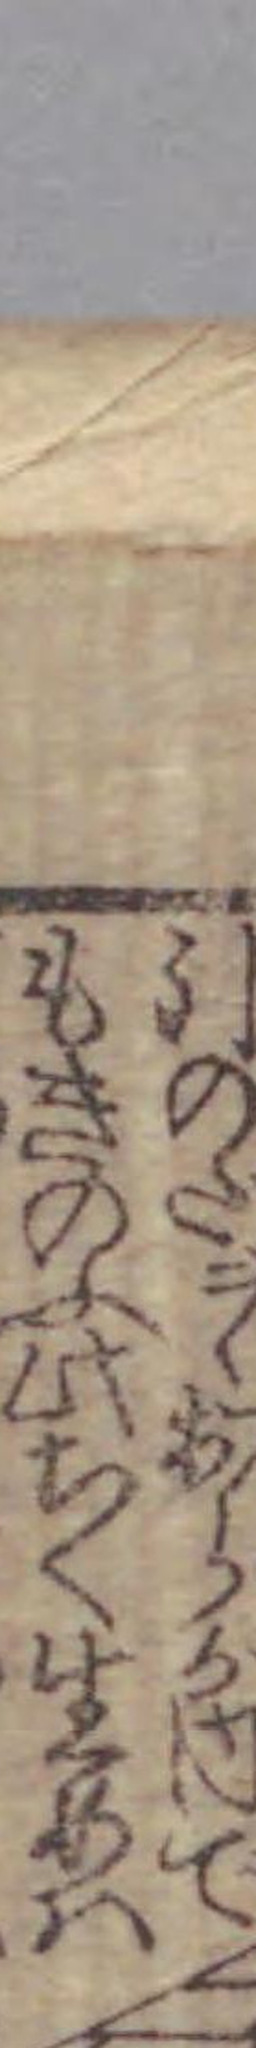もきのふ此ちく生めは
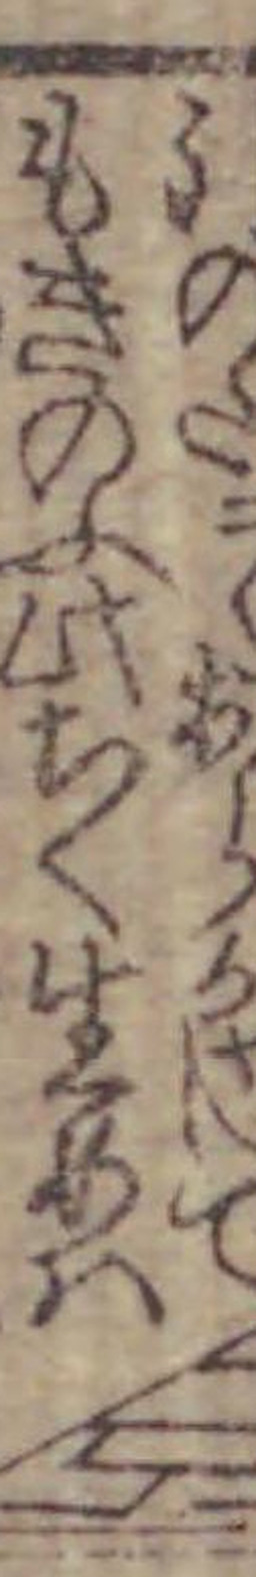もきのふ此ちく生めは
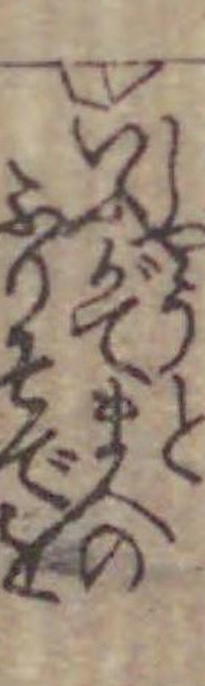ふりそでを
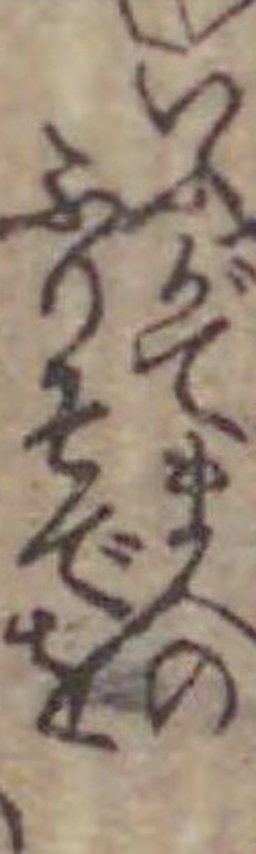ふりそでを
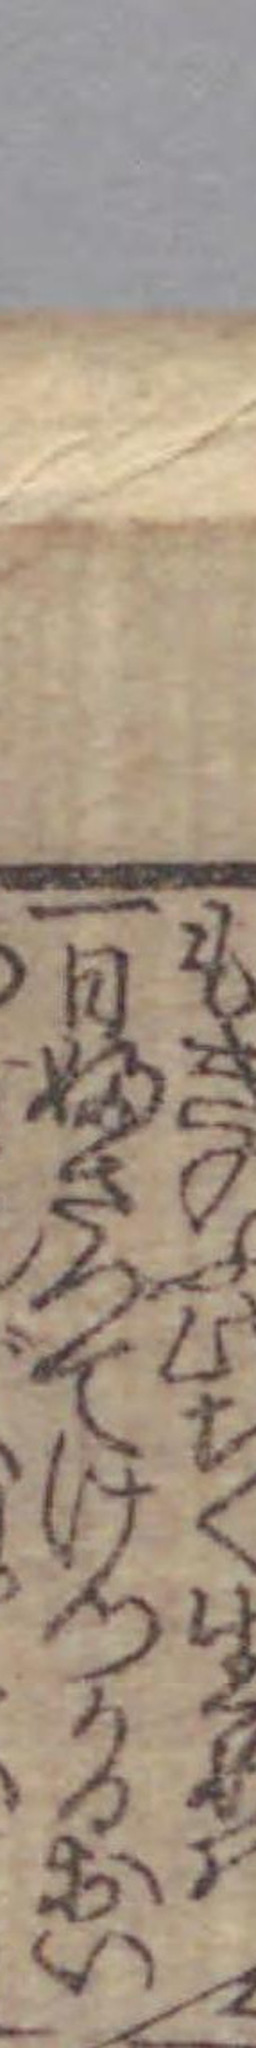一日ふさつてけつかるおい
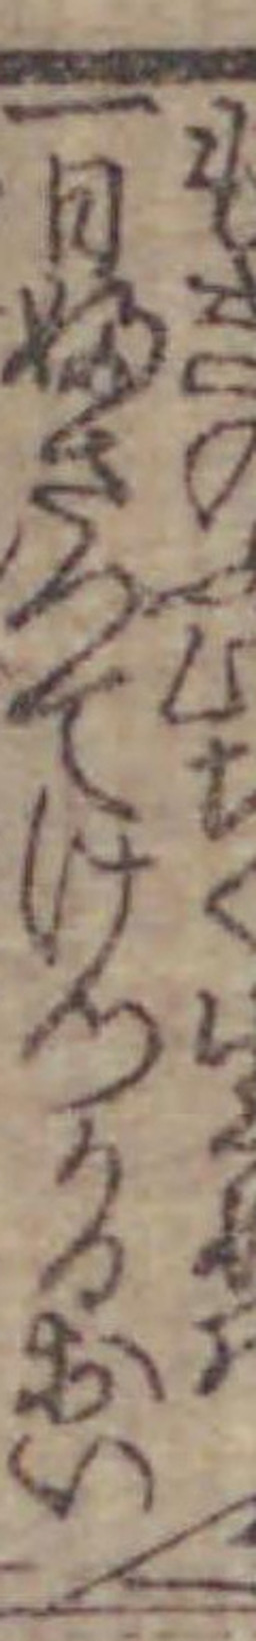一日ふさつてけつかるおい
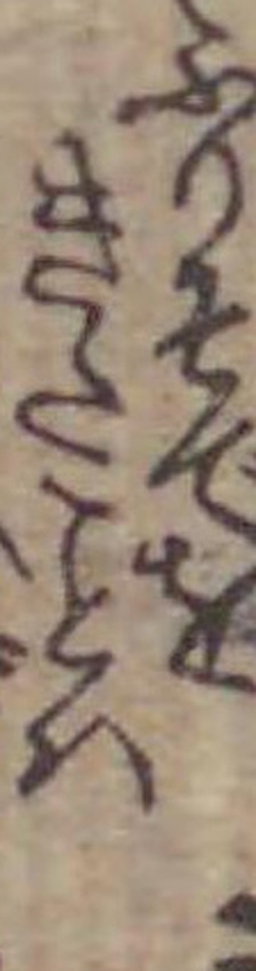きたことは
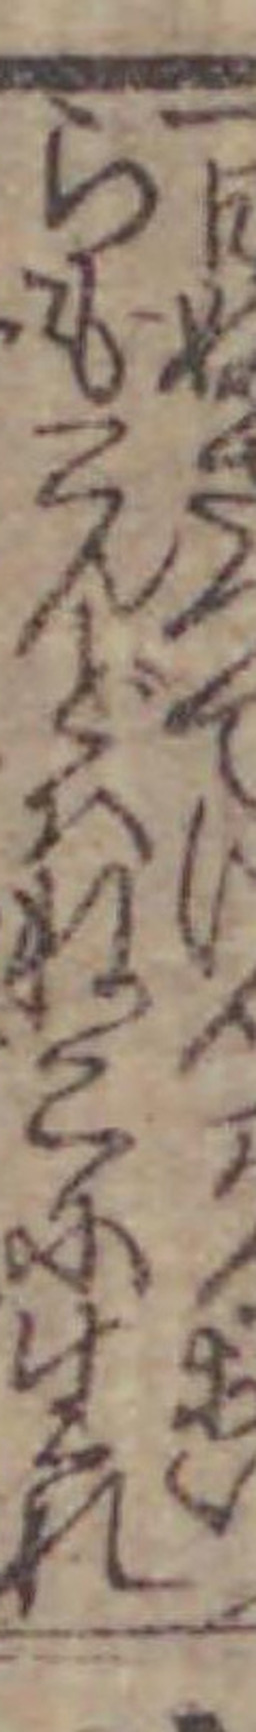らもこんどはねとに生れ
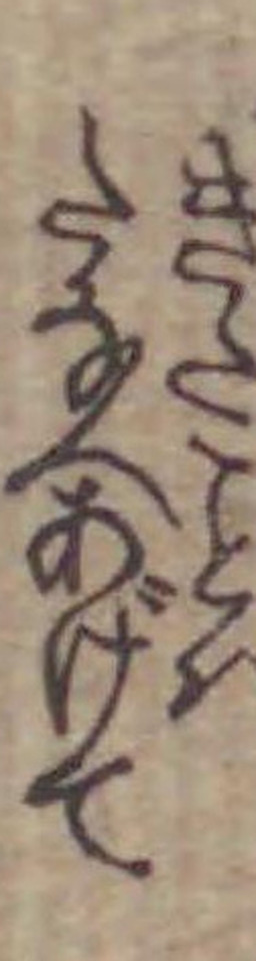たなへあげて
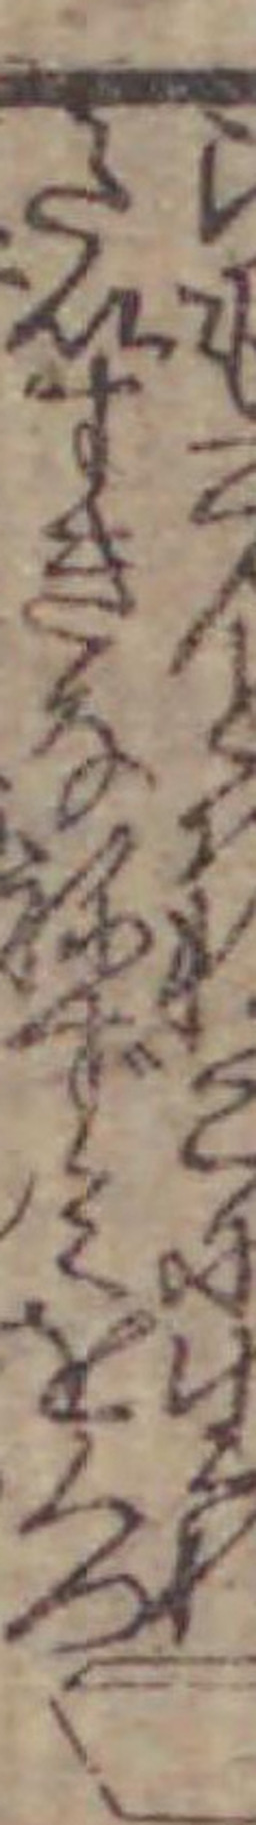たいすきなねずみをくつ
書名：即席耳学問 : 3巻
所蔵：国立国会図書館 National Diet Library, JAPAN
